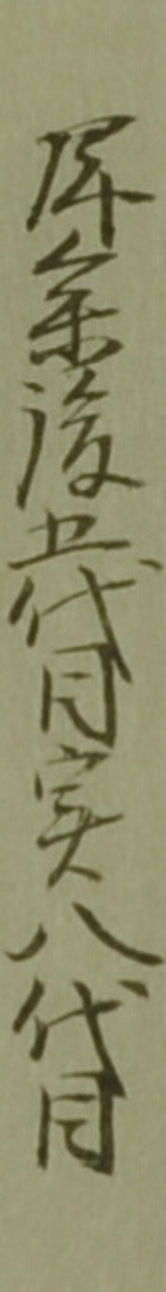帰参後五代目実八代目
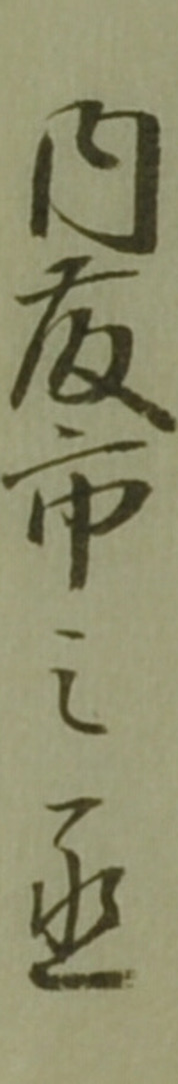内藤市之丞
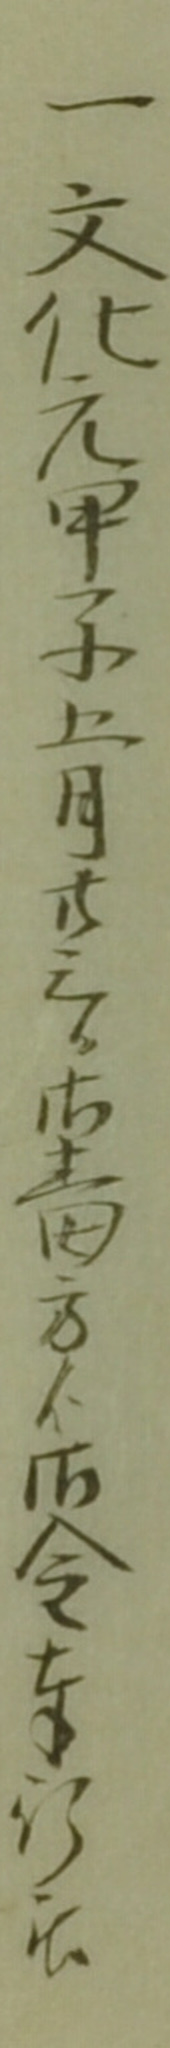一文化元甲子五月廿三日御番方ゟ御金奉行被
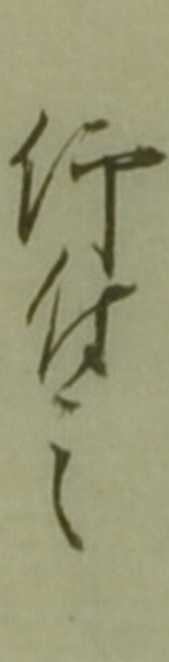仰付之
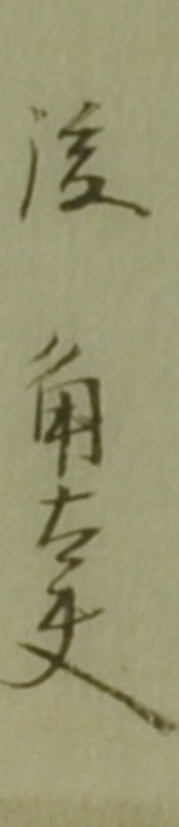後角太夫
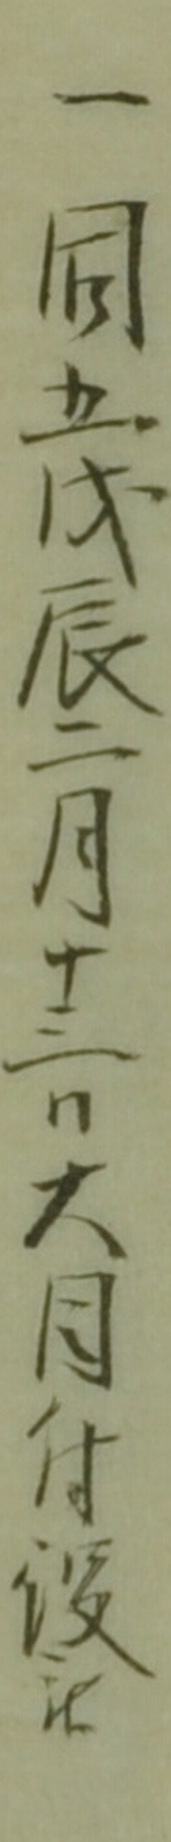一同五戊辰二月十三日大目付役被
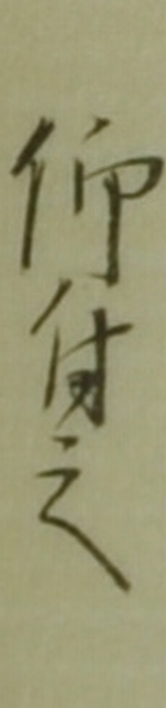仰付之
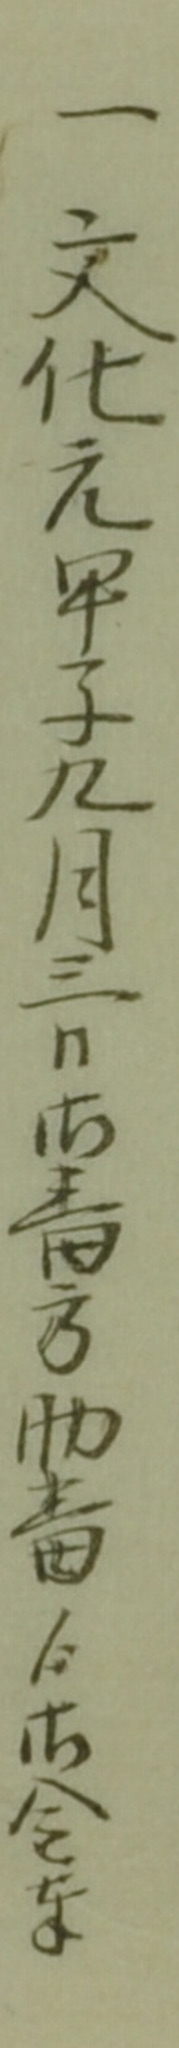一文化元甲子九月三日御番方助番ゟ御金奉
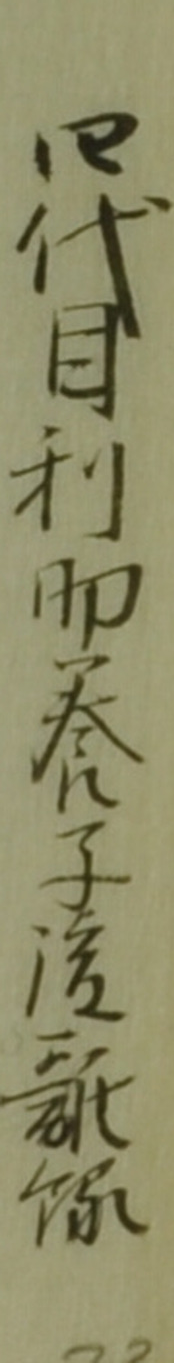四代目利助養子後離縁
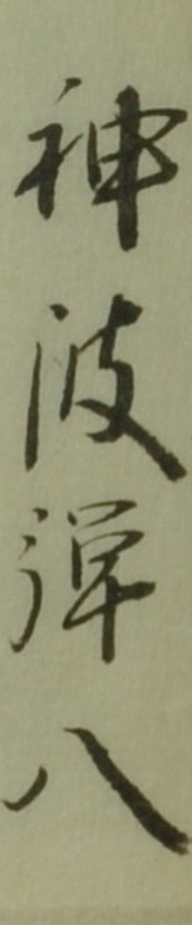神波弾八
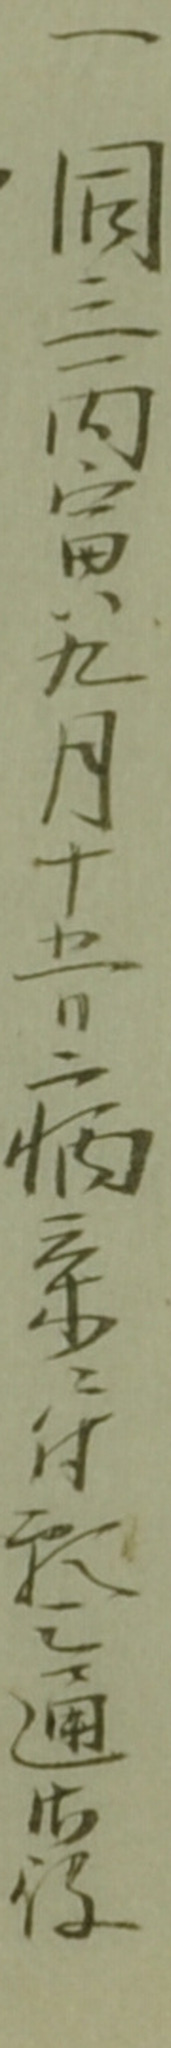一同三丙寅九月十五日病気ニ付願之通御役
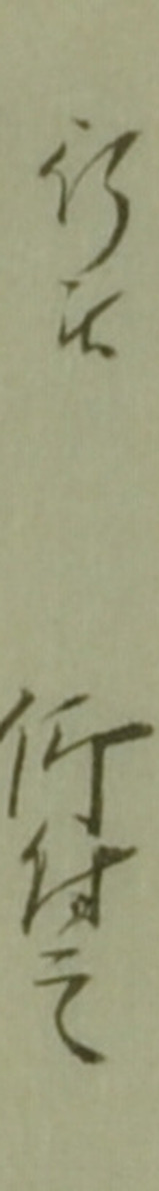行被仰付之
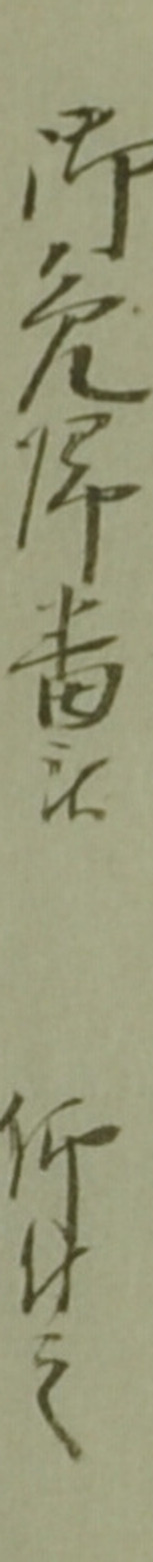御免帰番被仰付之
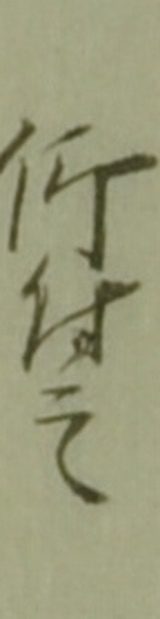仰付之
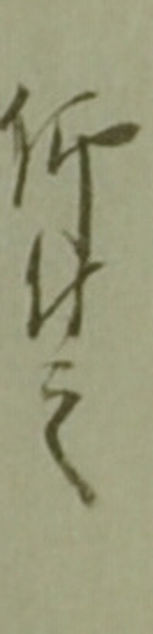仰付之
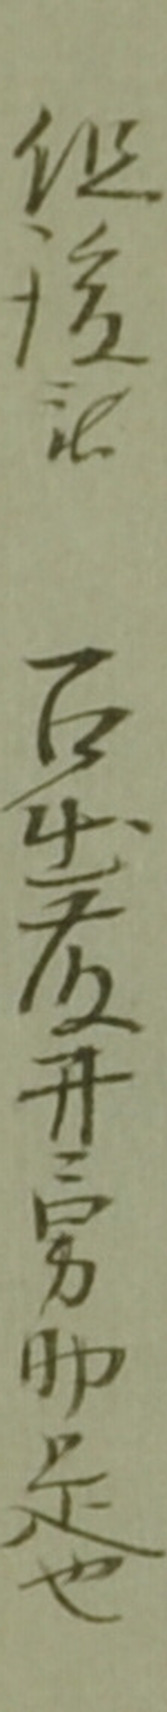但後被召出藤井旁助是也
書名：諸御役代々録（七）
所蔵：伊那市立高遠町図書館・合同会社AMANE
